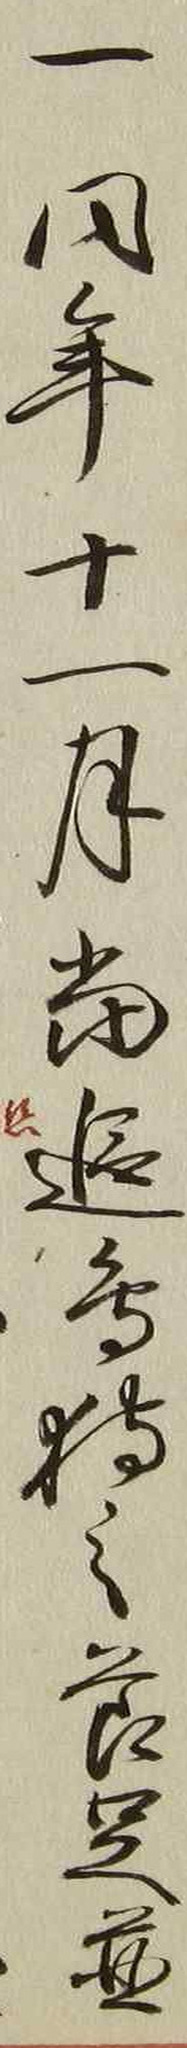一同年十一月当追鳥狩之節足並
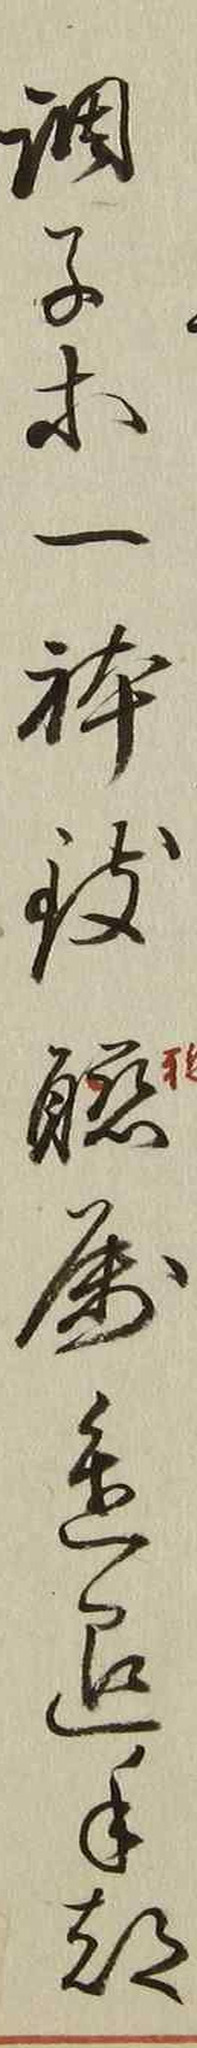調子等一体致属追而都
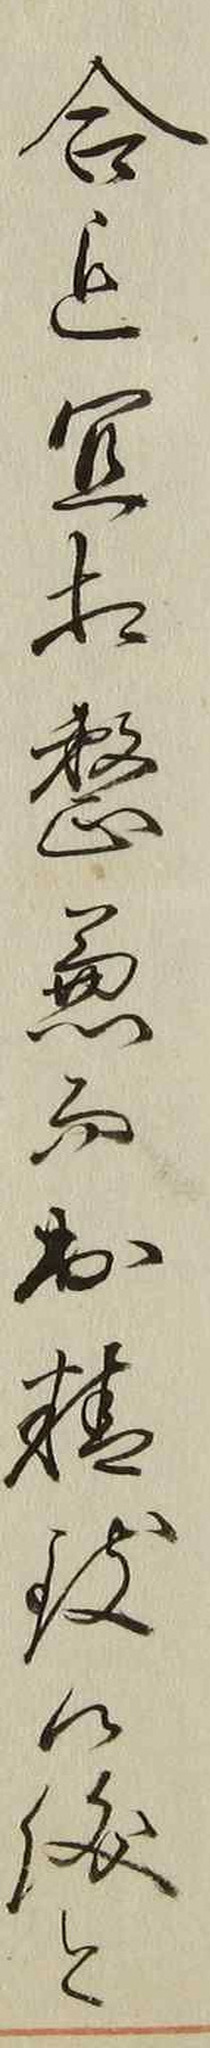合宜相整兼而出精致候儀と
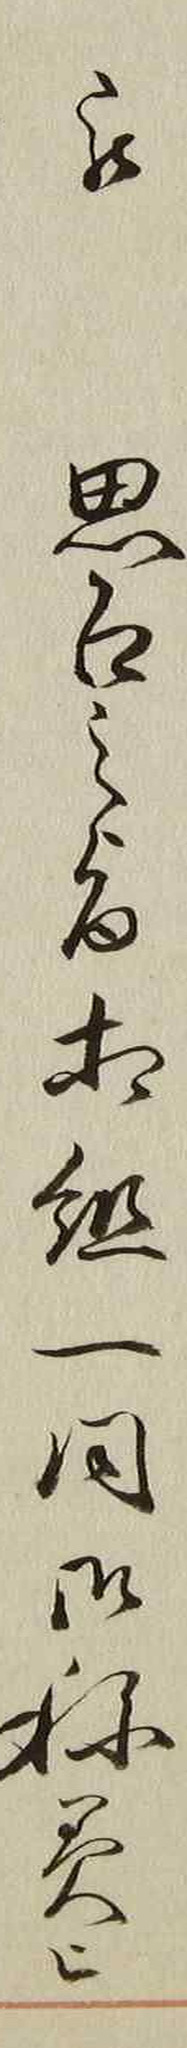被思召之旨於組一同御称美被
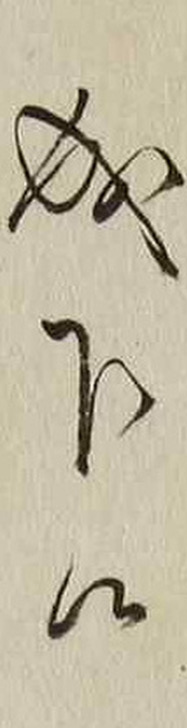成下候
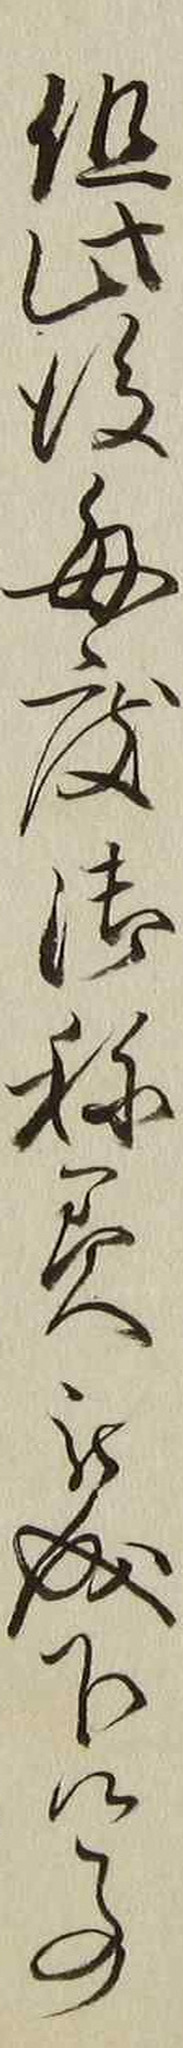但此後毎度御称美被成下候事
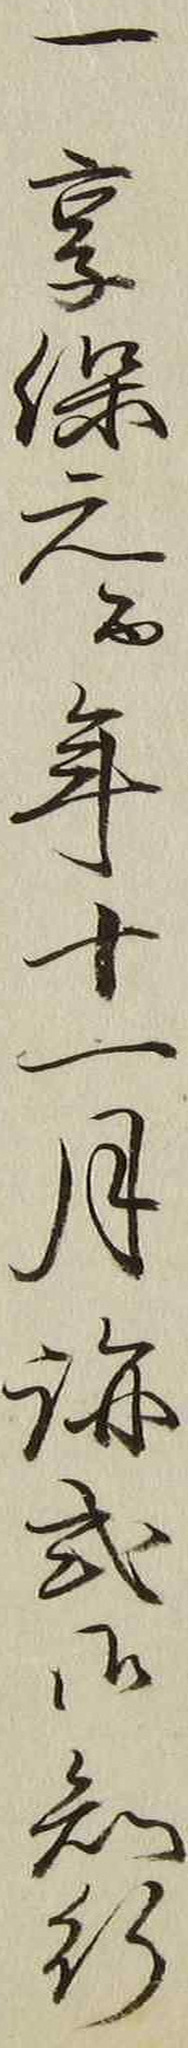一享保元酉年十一月跡式御知行
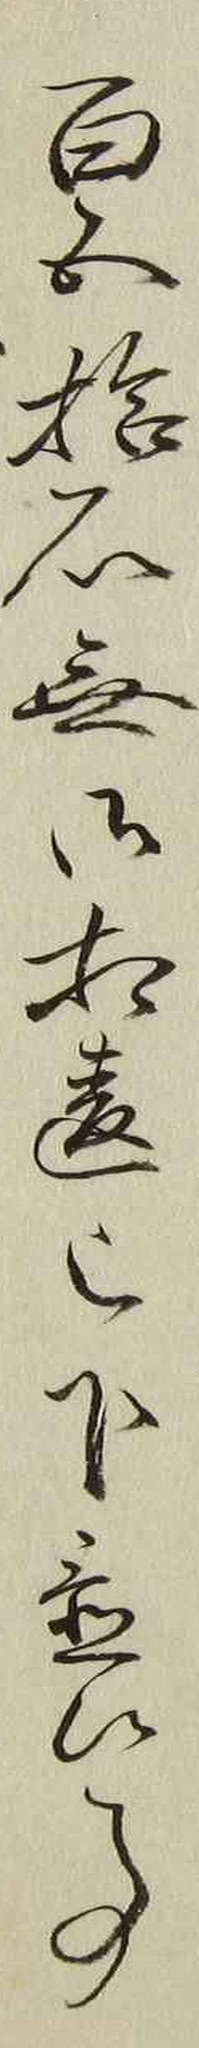百五拾石無御相違被下置候事
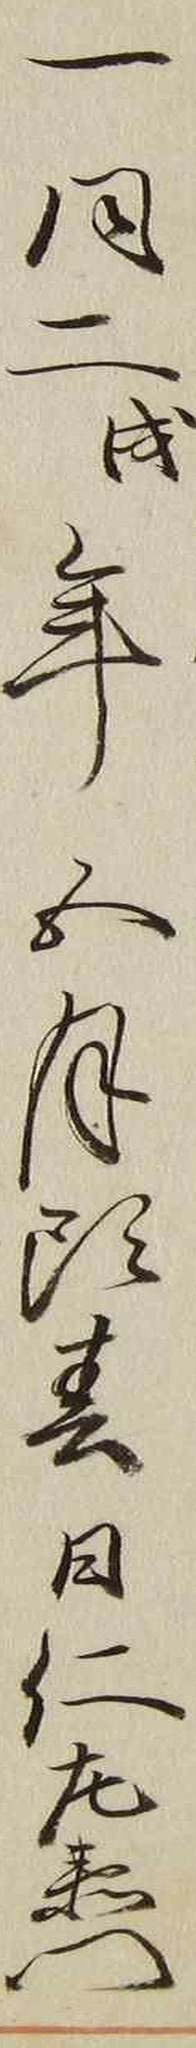一同二戌年五月頭春日仁左衛門
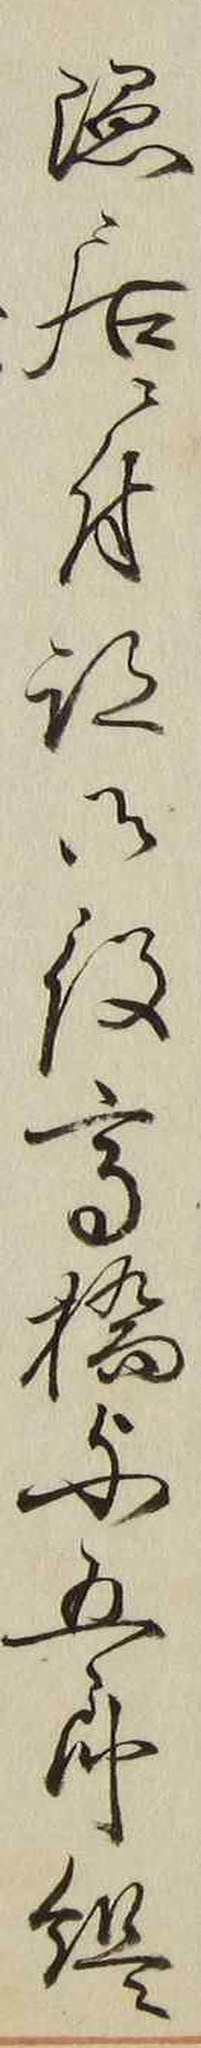隠居ニ付跡御役高橋与五郎組ニ
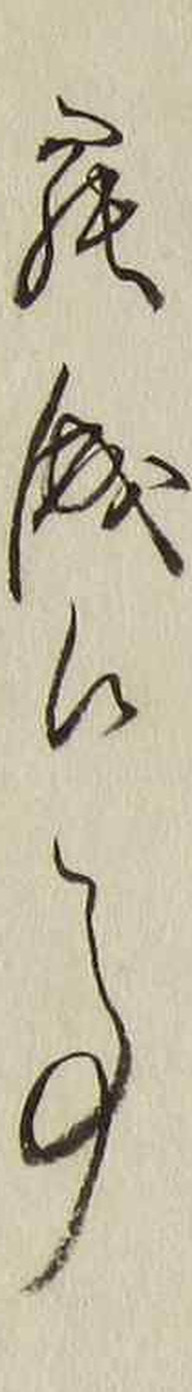罷成候事
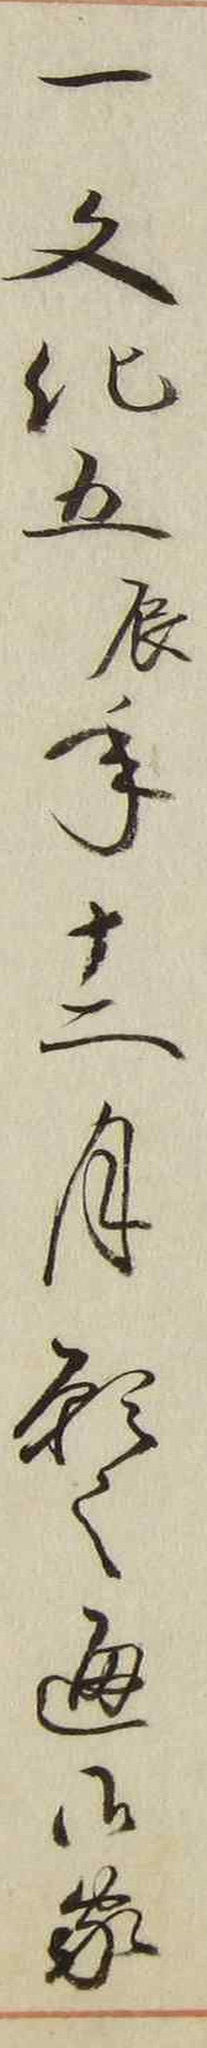一文化五辰年十二月願之通御家

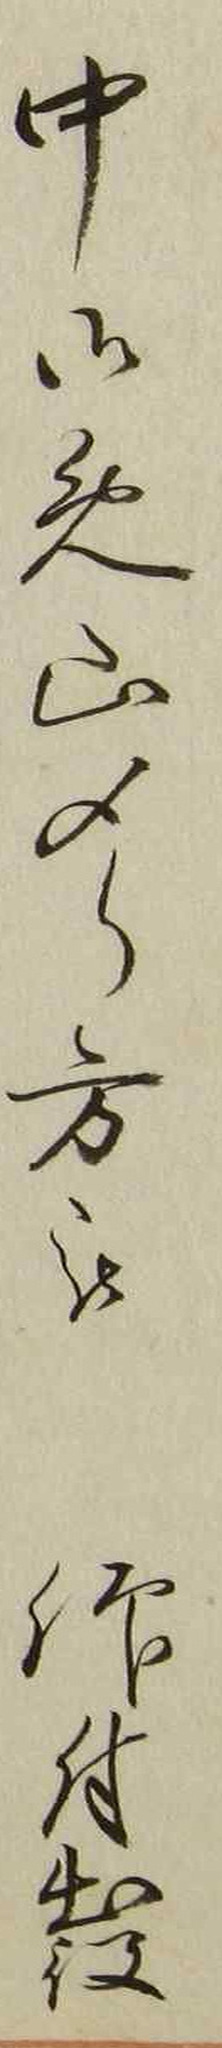中御免山〆り方被仰付出役
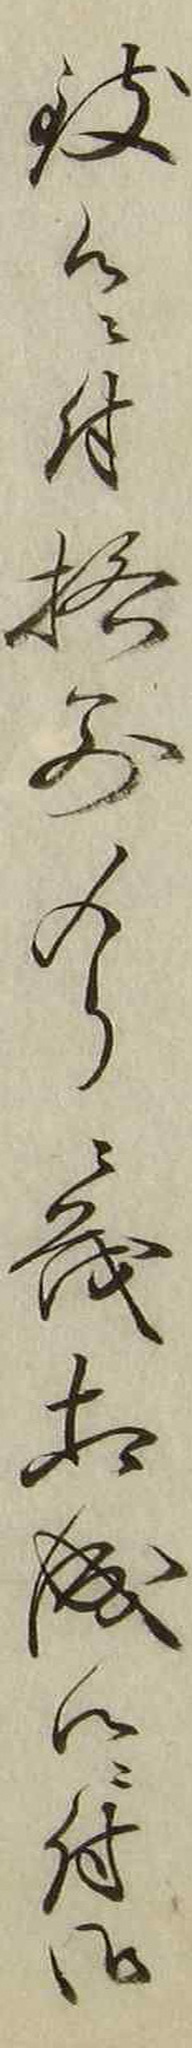致候ニ付格別〆りニも相成候ニ付御
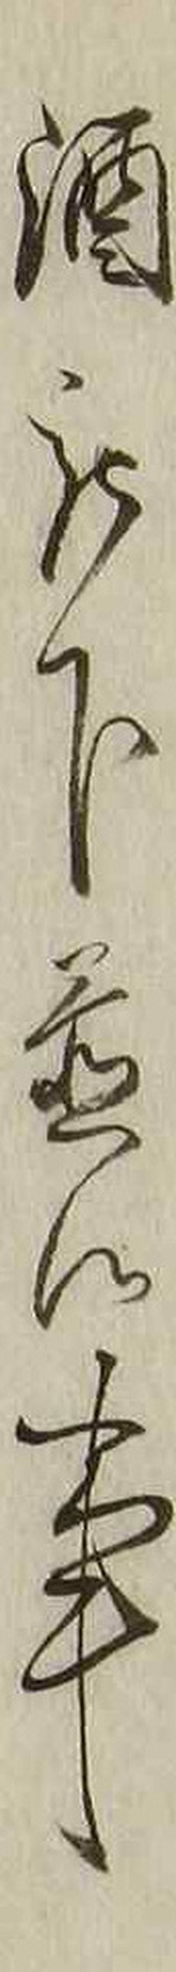酒被下置候事
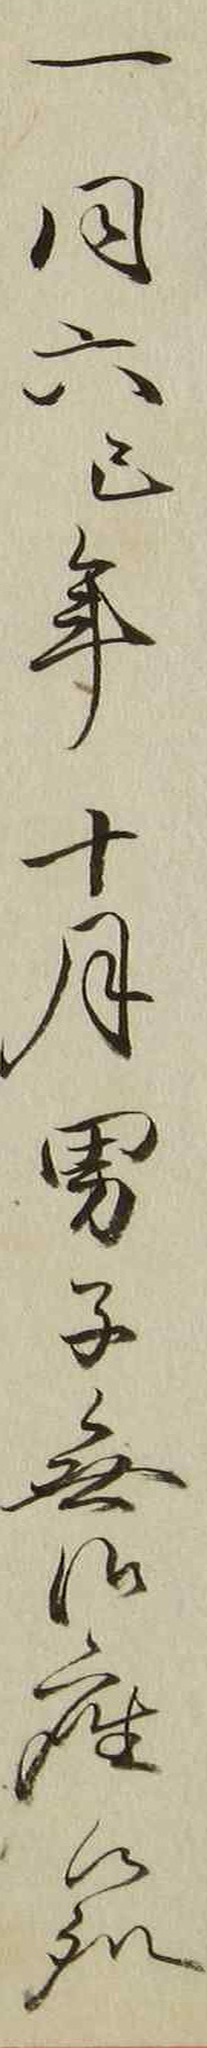一同六巳年十月男子無御座候処
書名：諸士系譜　巻之54　ほ之部1
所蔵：会津若松市立会津図書館
